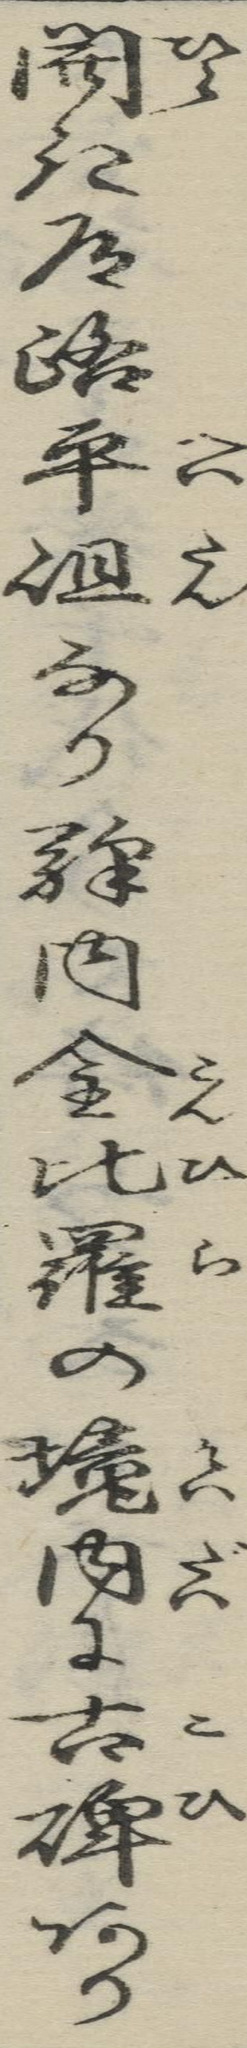開き道路平坦なり駅内金毘羅の境内に古碑あり
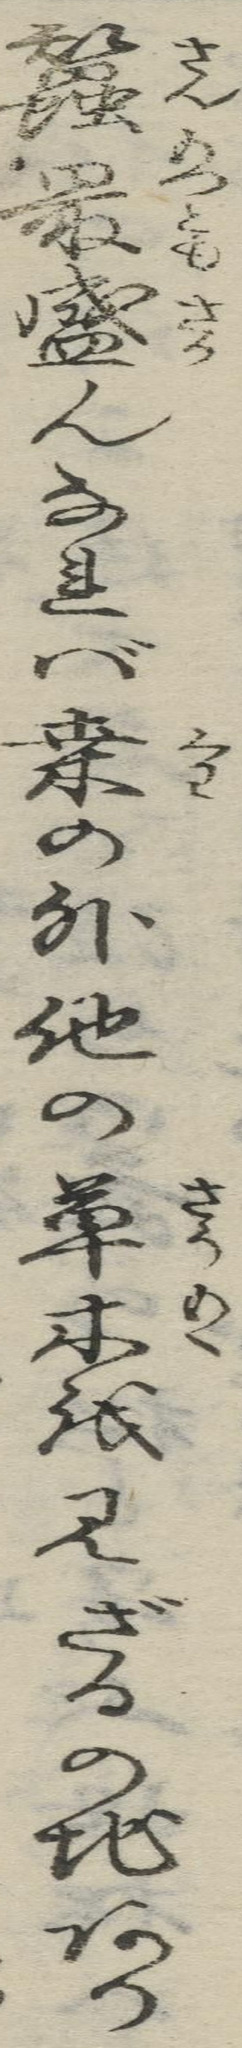蚕最盛んなれば桑の外他の草木を見ざるの地あり
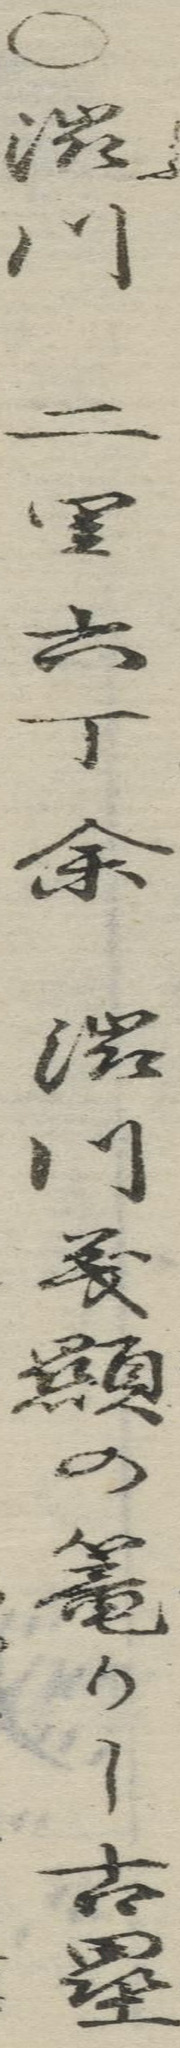○渋川二里六丁余渋川義顕の篭りし古塁
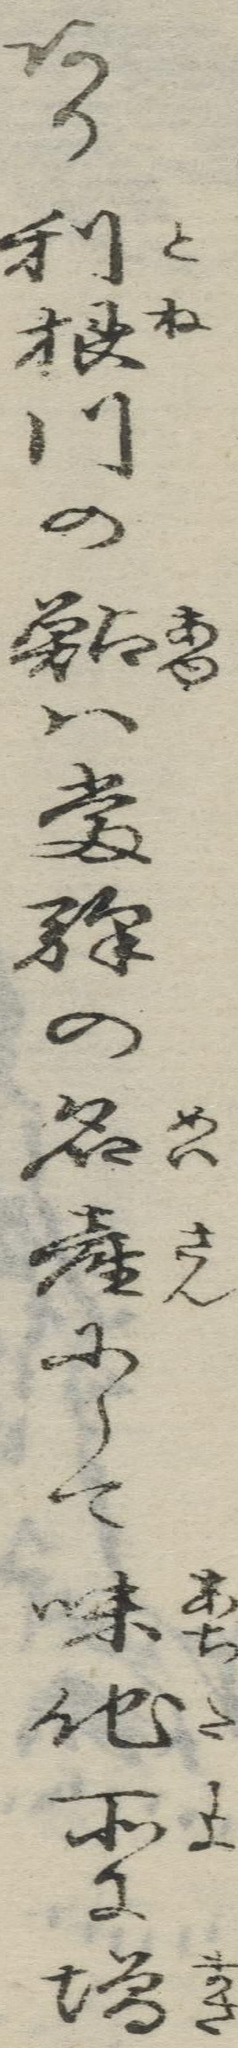あり利根川の鮎は当駅の名産にして味他所に増
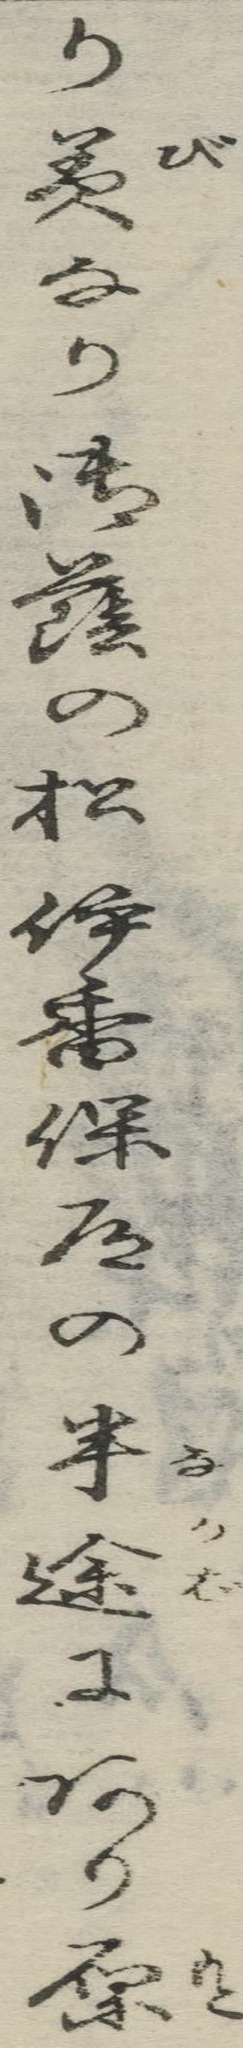り美なり御蔭の松伊香保道の半途にあり原
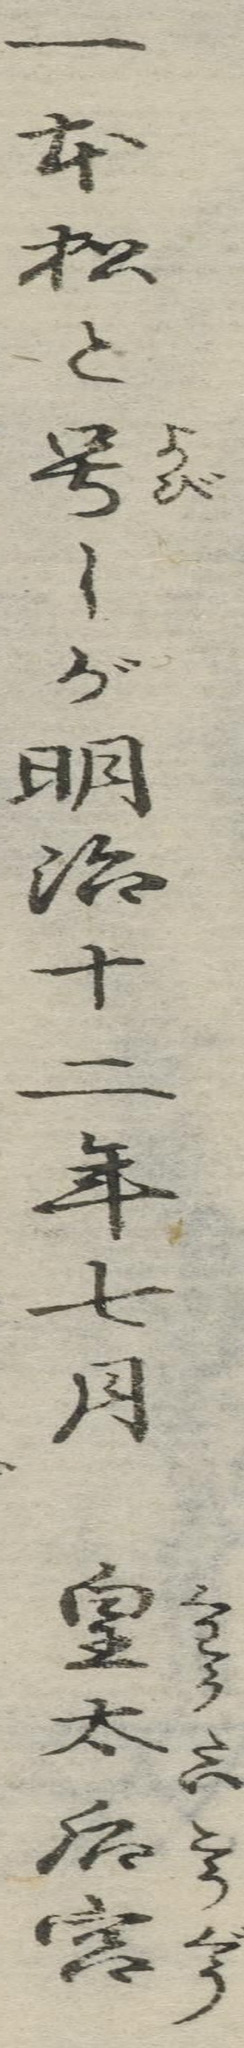一本松と号しが明治十二年七月皇太后宮
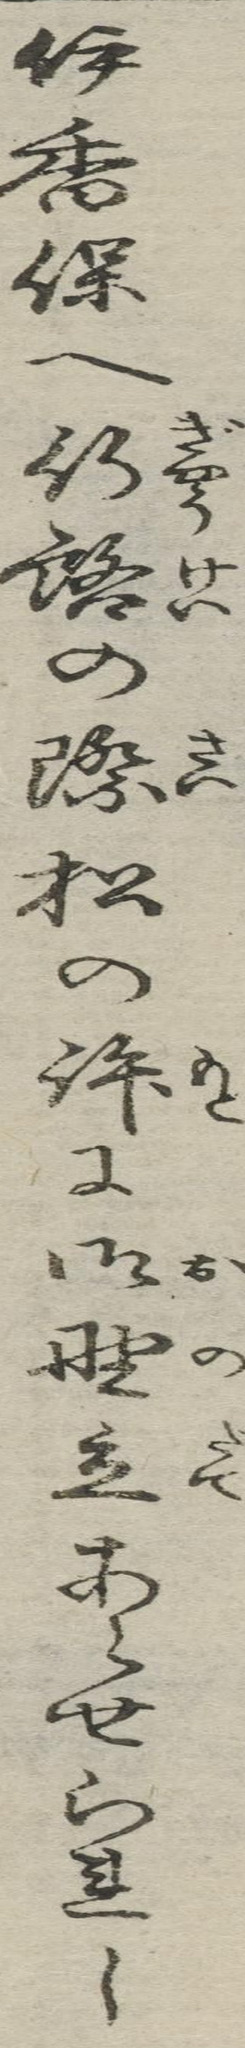伊香保へ行啓の際松の許に御野立あらせられし
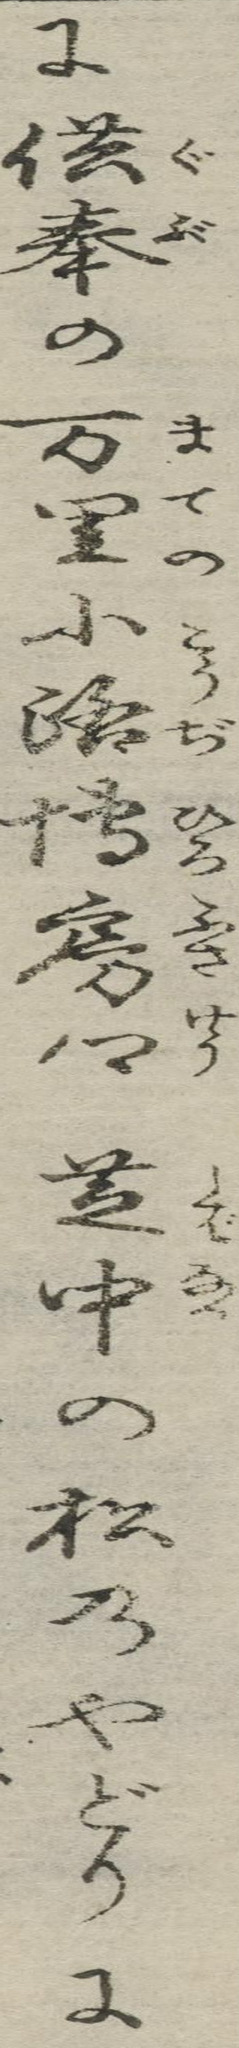に供奉の万里小路博房卿芝中の松のやどりに
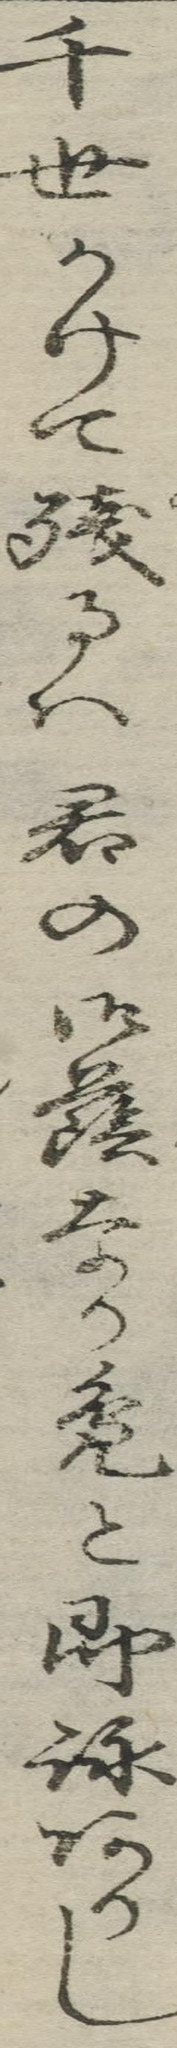千代かけて残るは君の御蔭なり鳬と即詠ありし
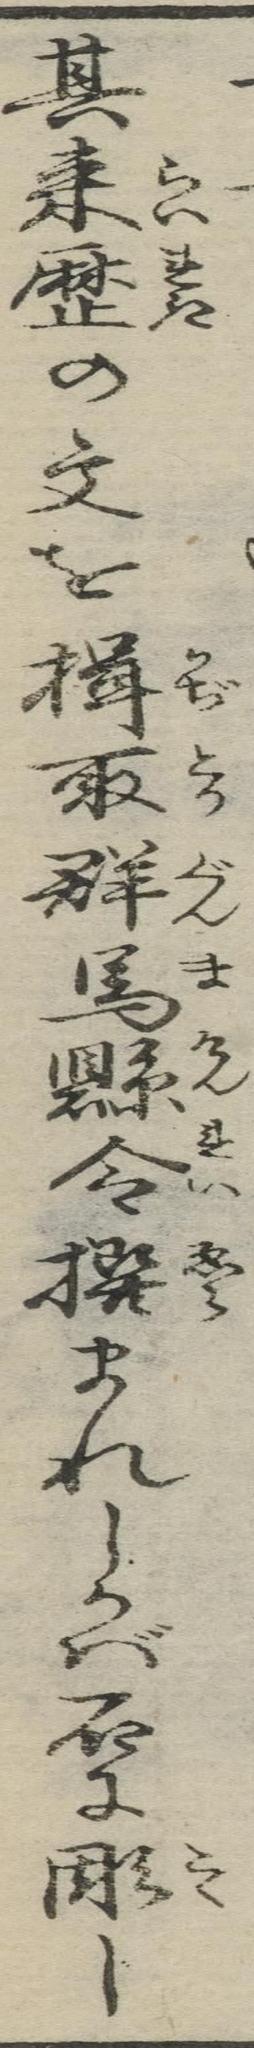其来歴の文を楫取群馬県令撰まれしかば石に彫し

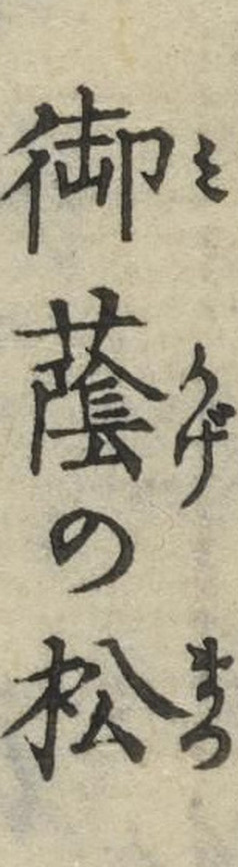御蔭の松
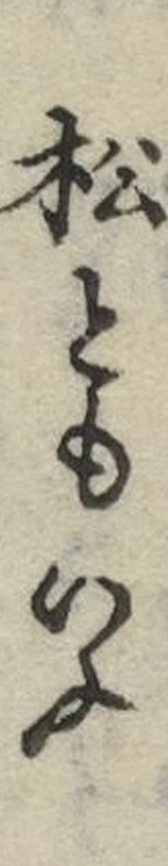松ともいふ
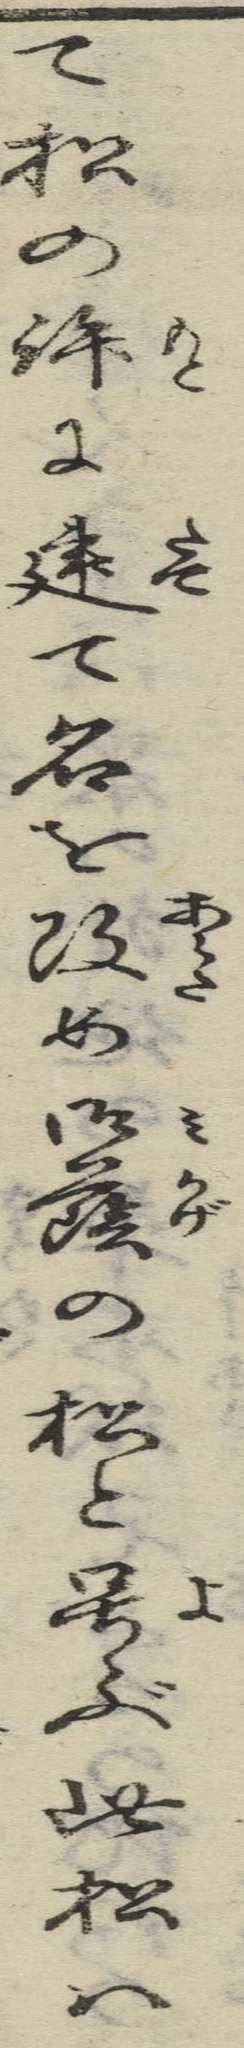て松の許に建て名を改め御蔭の松と号ぶ此松は
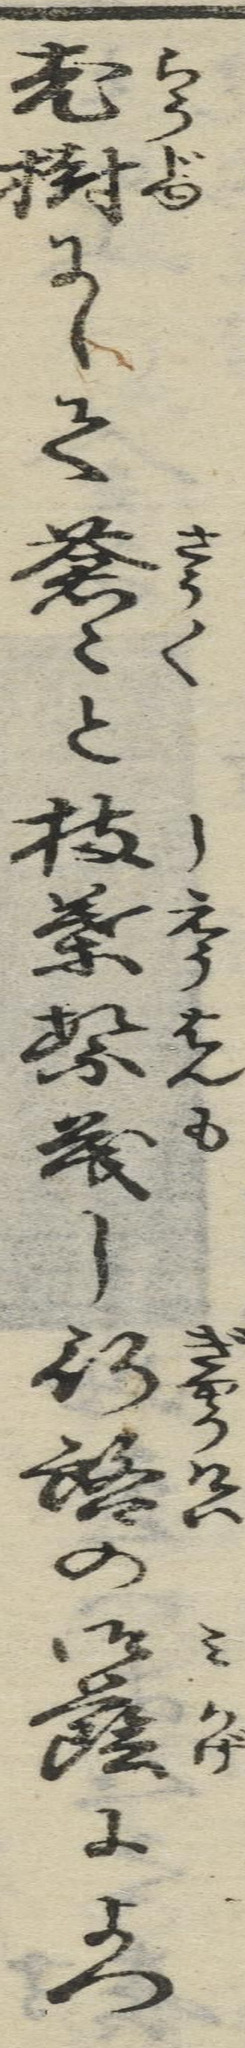老樹にして蒼々と枝葉繁茂し行啓の御蔭によつ
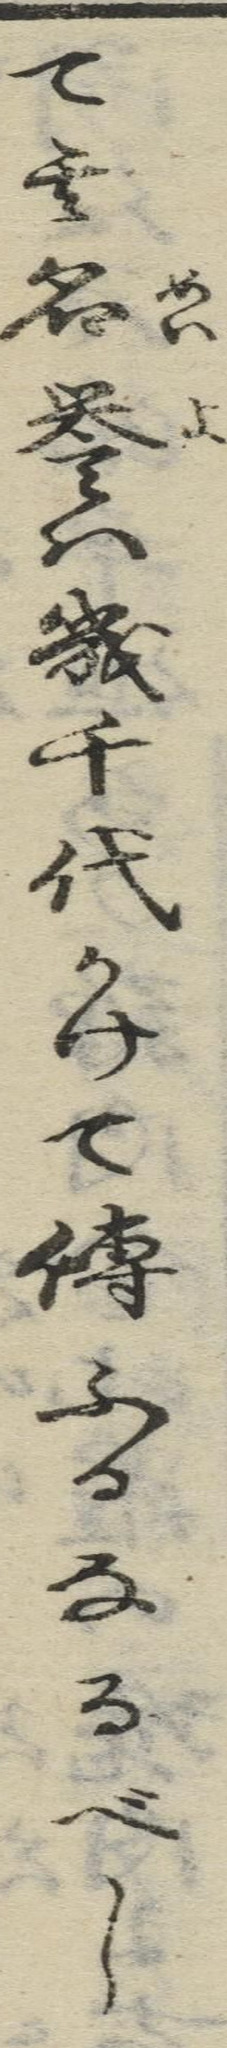て其名誉は幾千代うけて傳ふるなるべし
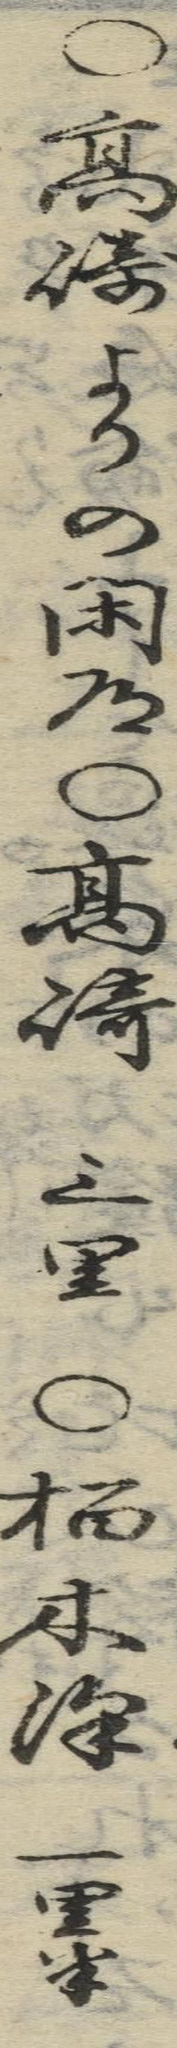○高崎よりの閑道○高崎三里○柏木沢一里半
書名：上州伊香保鑛泉圖會　全
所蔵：東京大学地震研究所図書室 Earthquake Research Institute Library, The University of Tokyo, JAPAN
